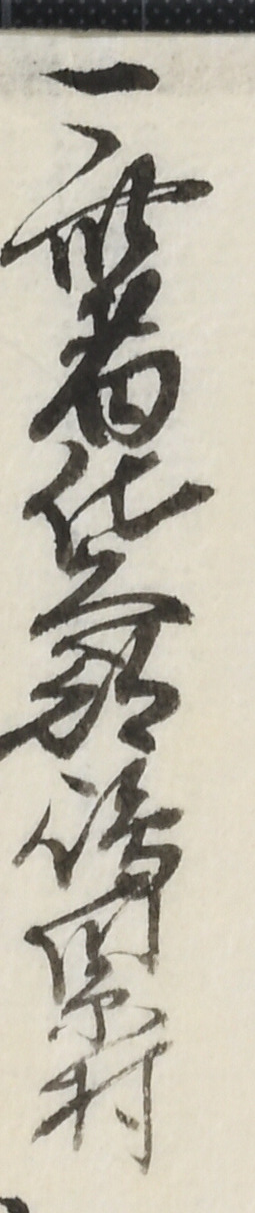一此者佐久郡島川原村
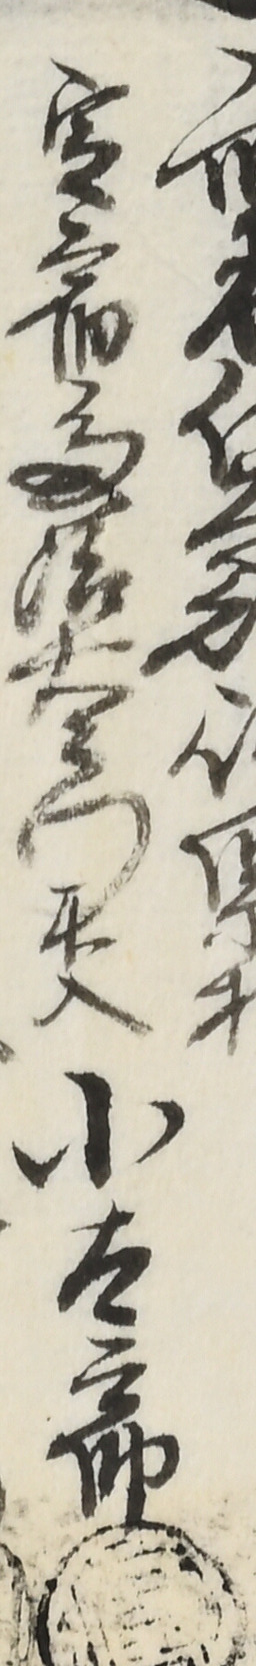定宿多治右衛門本人小太郎㊞

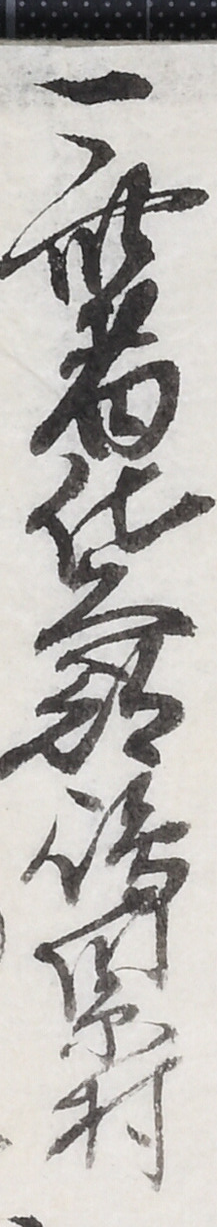一此者佐久郡島河原村
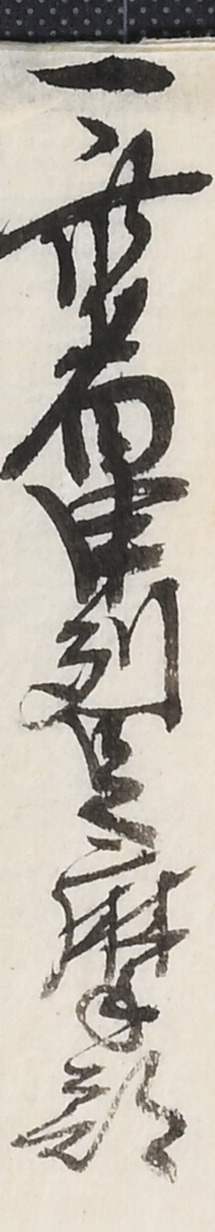一此者甲州巨摩郡
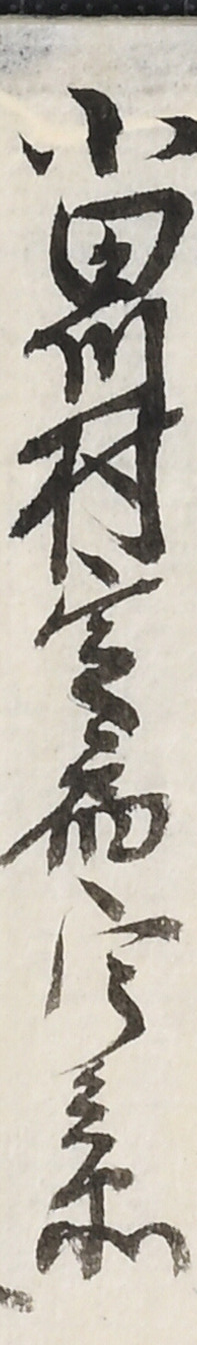小田川村定宿宇兵衛
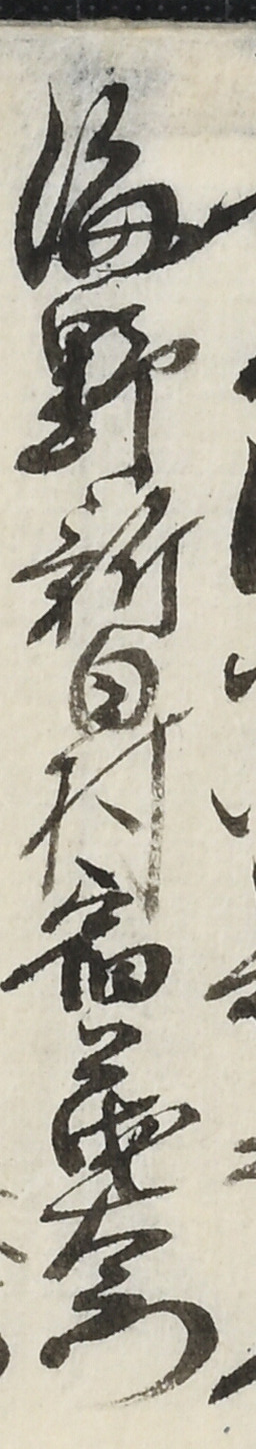海野新田村宿茂右衛門

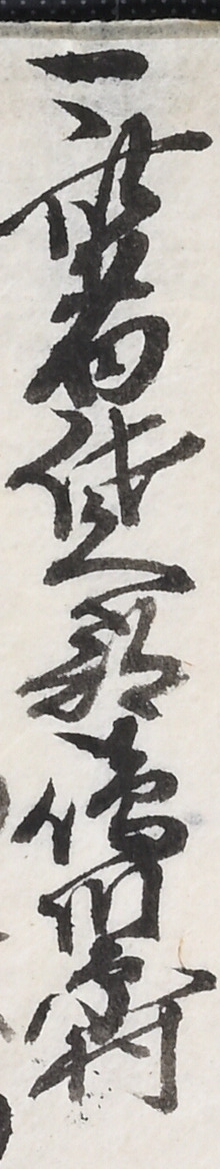一此者佐久郡島川原村
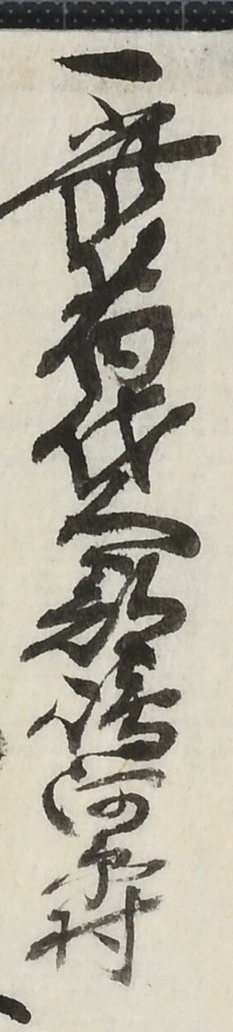一此者佐久郡島川原村

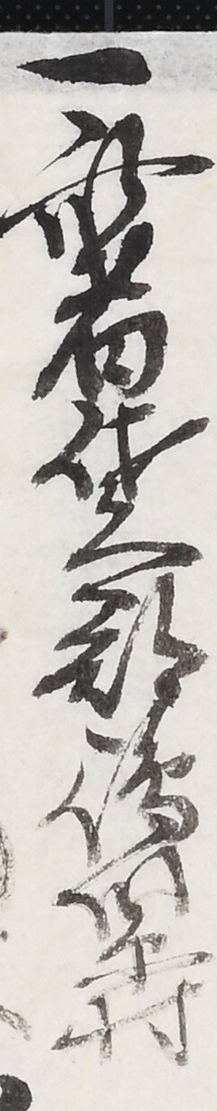一此者佐久郡島川原村
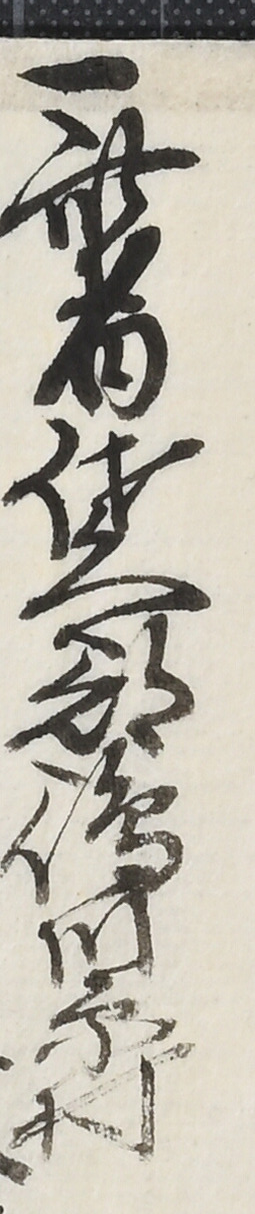一此者佐久郡島川原村
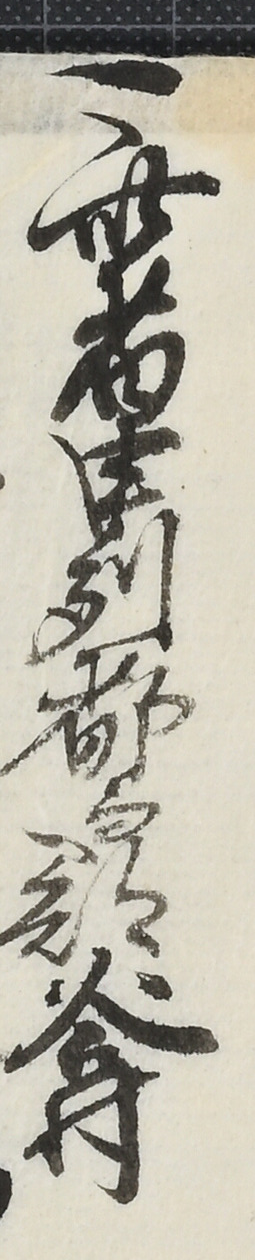一此者甲州都留郡谷村

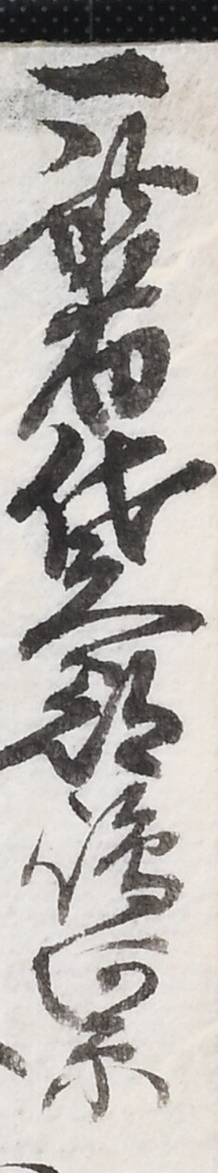一此者佐久郡島河原
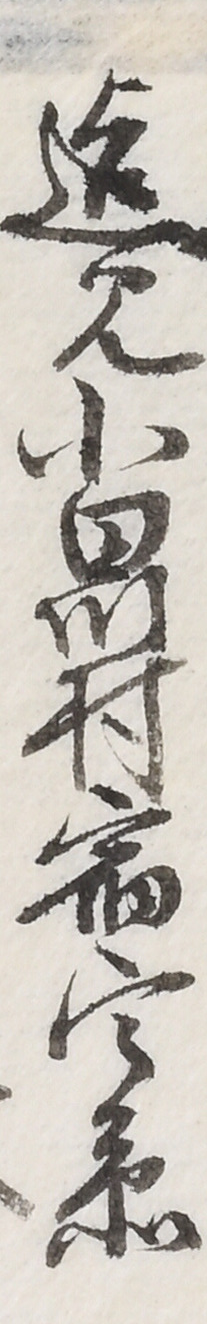逸見小田川村宿宇兵衛
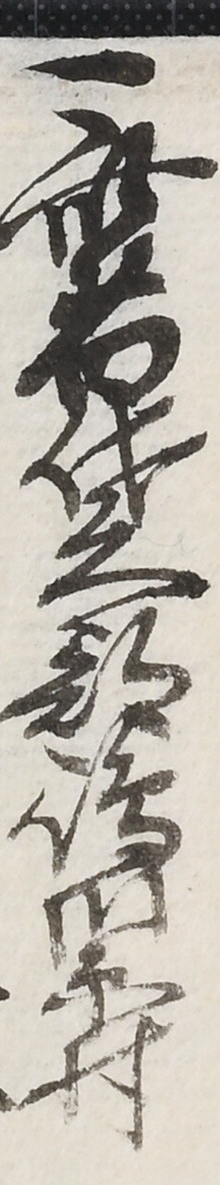一此者佐久郡島川原村
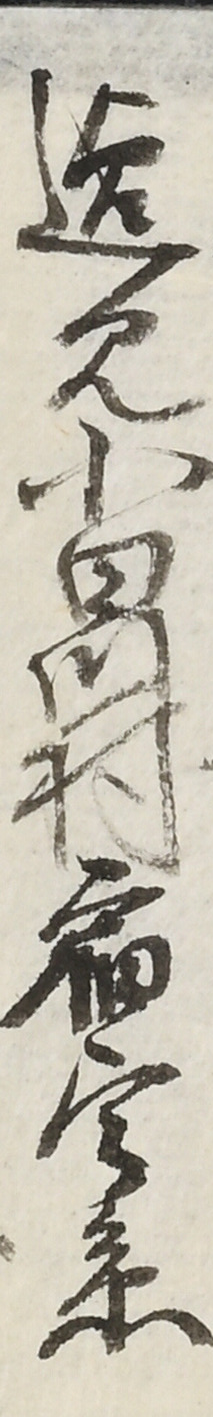逸見小田川村宿宇兵衛
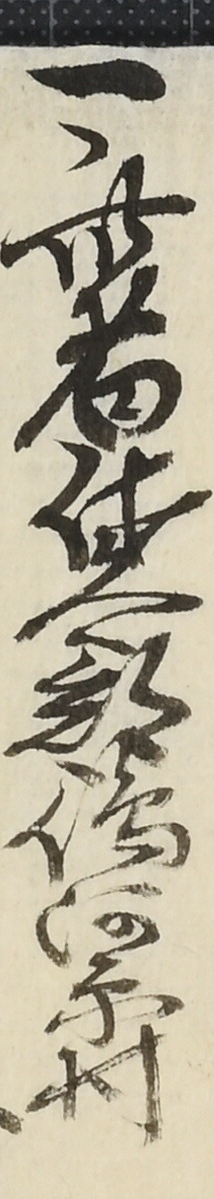一此者佐久郡島川原村
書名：文久二壬戌年正月他国石切名前書上帳
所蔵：伊那市立高遠町図書館・合同会社AMANE
